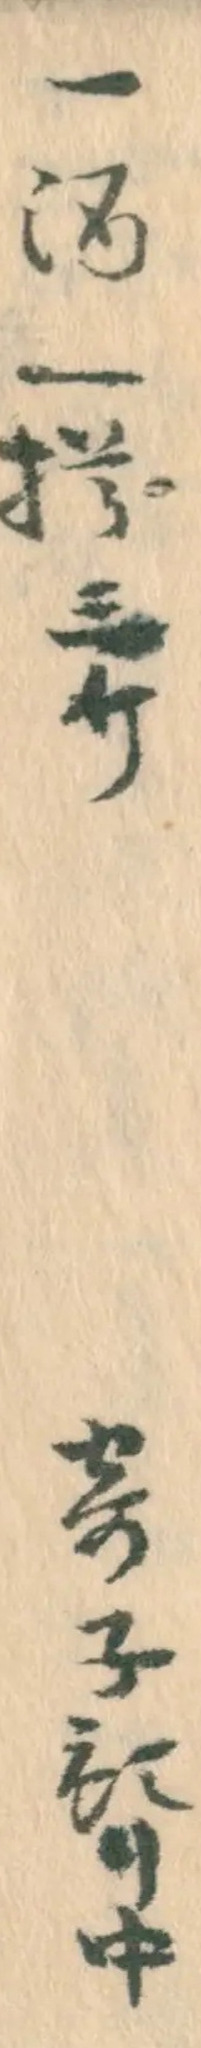一酒一樽三升寄子預り中
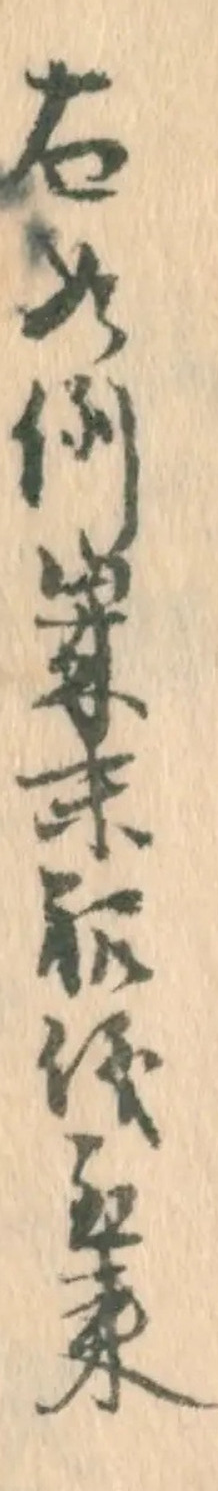右如例歳末祝儀到来
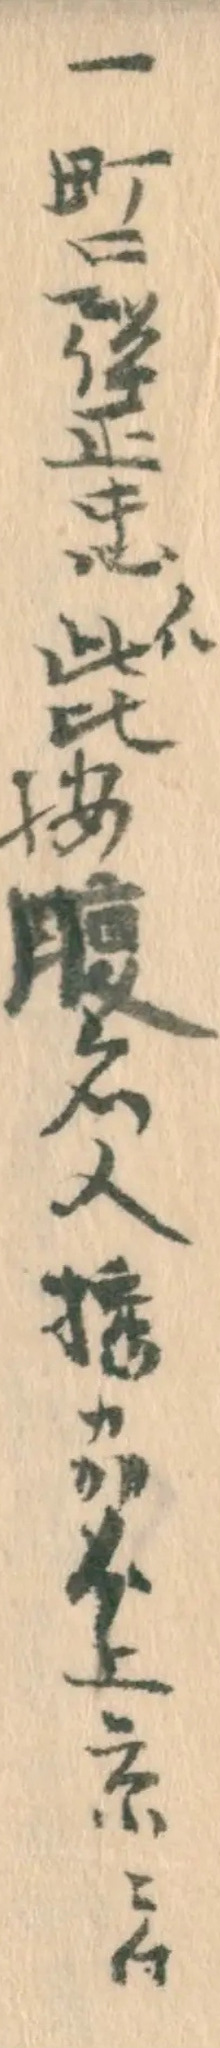一町口弾正忠ゟ此頃按腹名人摂州ゟ上京ニ付
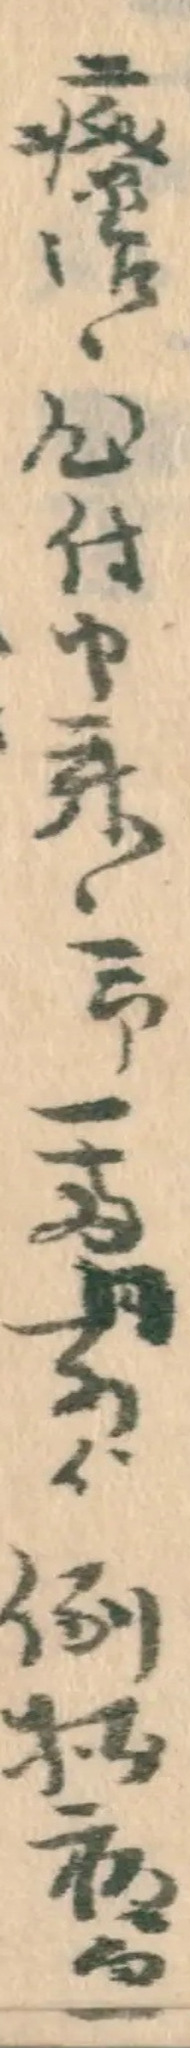療治候心付申来候予一両日前ゟ例持病ニ而
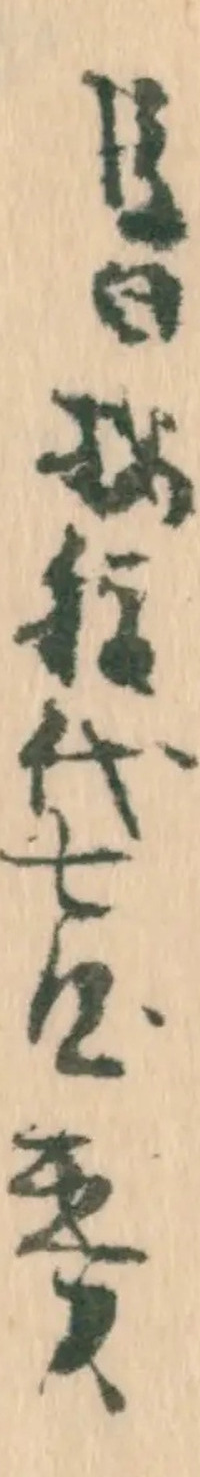後日按腹代七匁遣ス
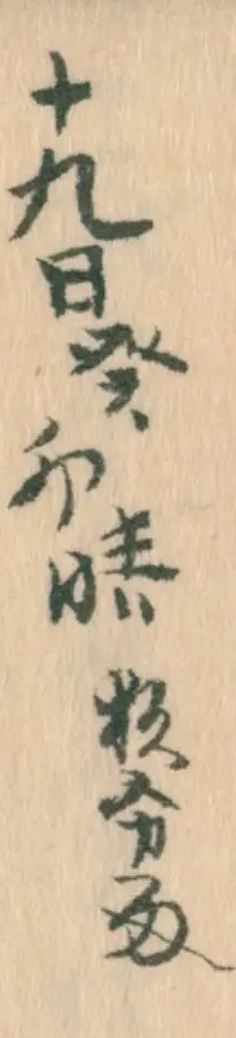十九日癸卯晴夜分雨
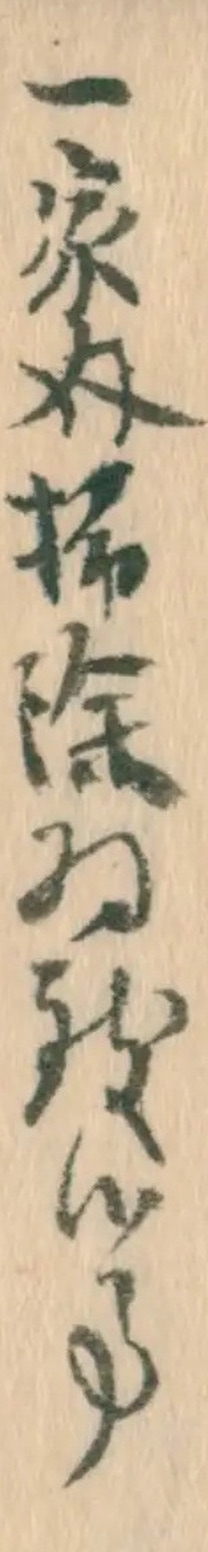一家内掃除為致候事
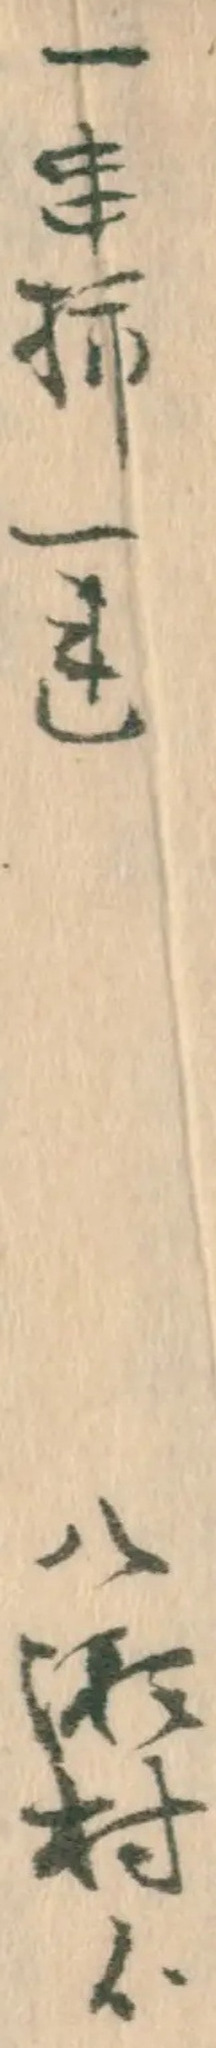一串柿一連八瀬村ゟ
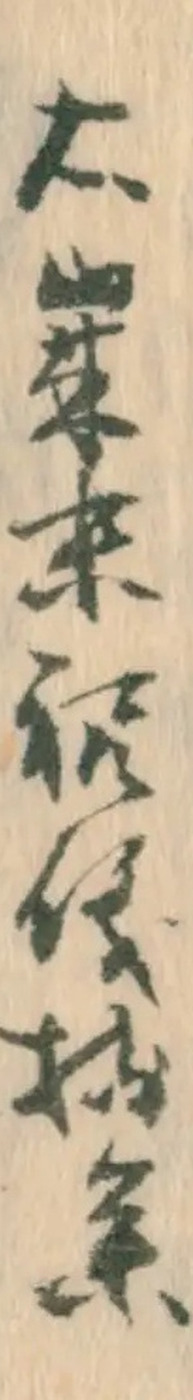右歳末祝儀持参
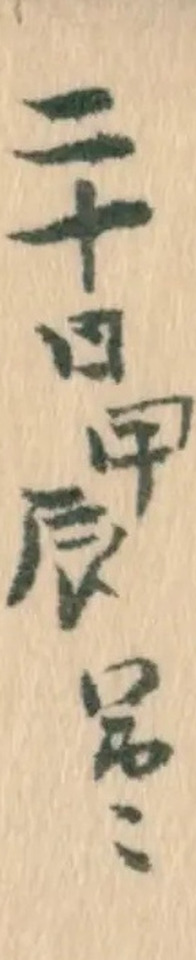二十日甲辰曇
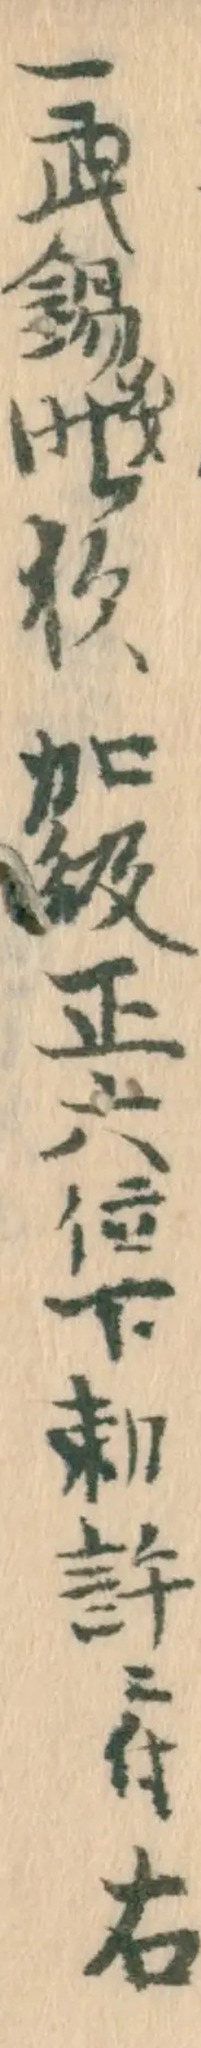一武錫義昨夜加級正六位下勅許ニ付右
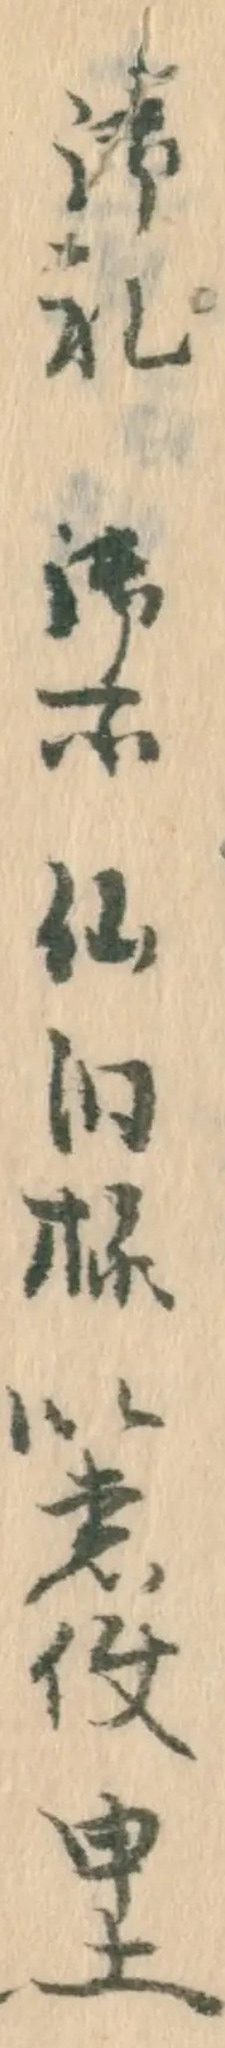御礼御所仙洞様以表使申上
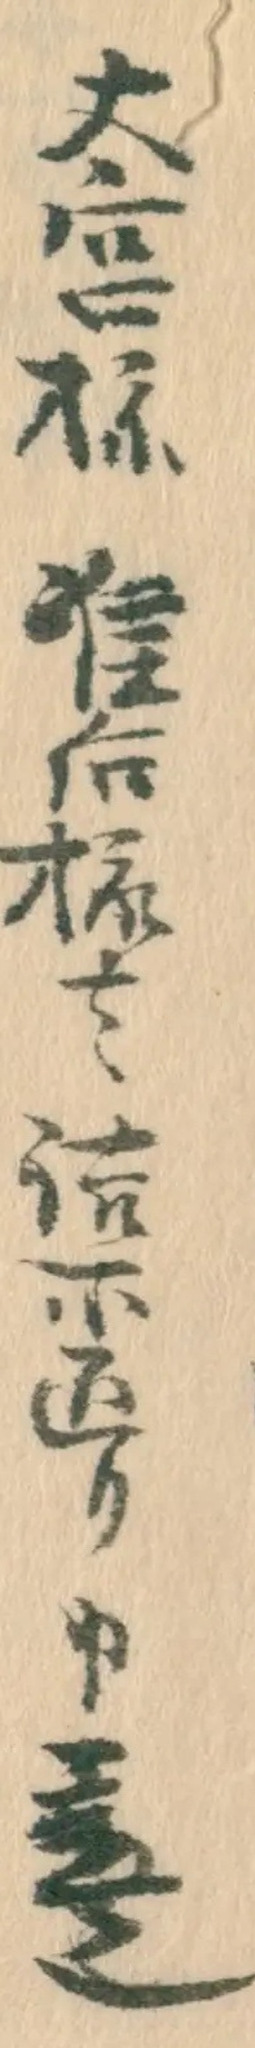大宮様准后様は詰所返り申置也
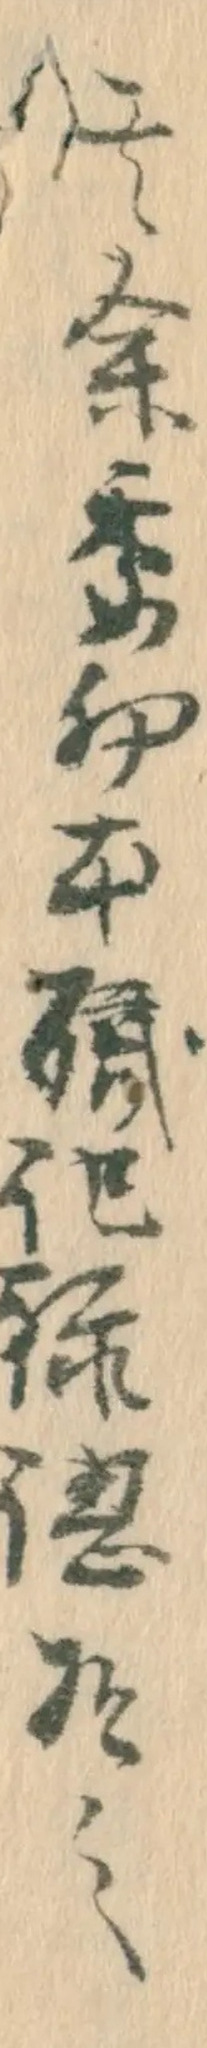其余委細本職記録認有之
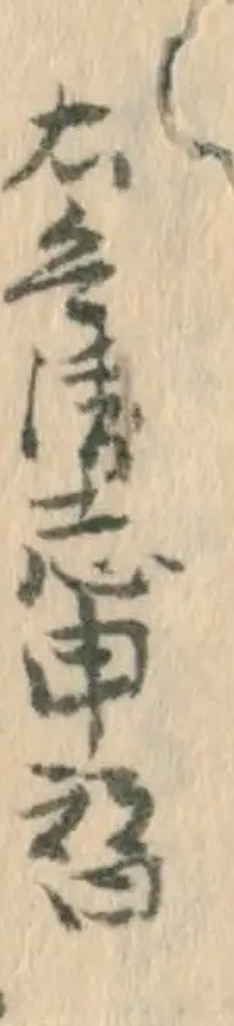右兵衛志申替
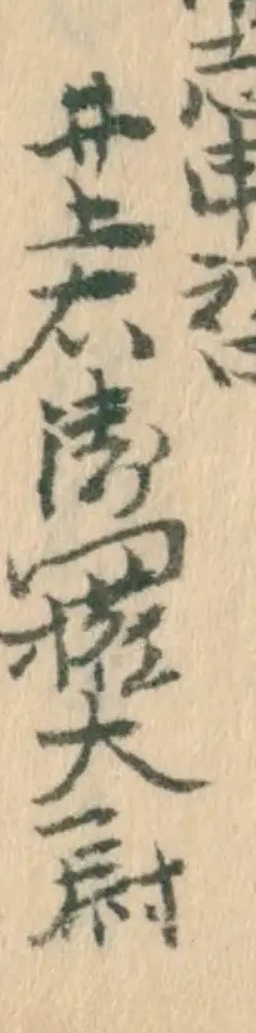一井上右衛門権大尉
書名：禁裏御所御用日記. [131]
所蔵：国立国会図書館 National Diet Library, JAPAN
